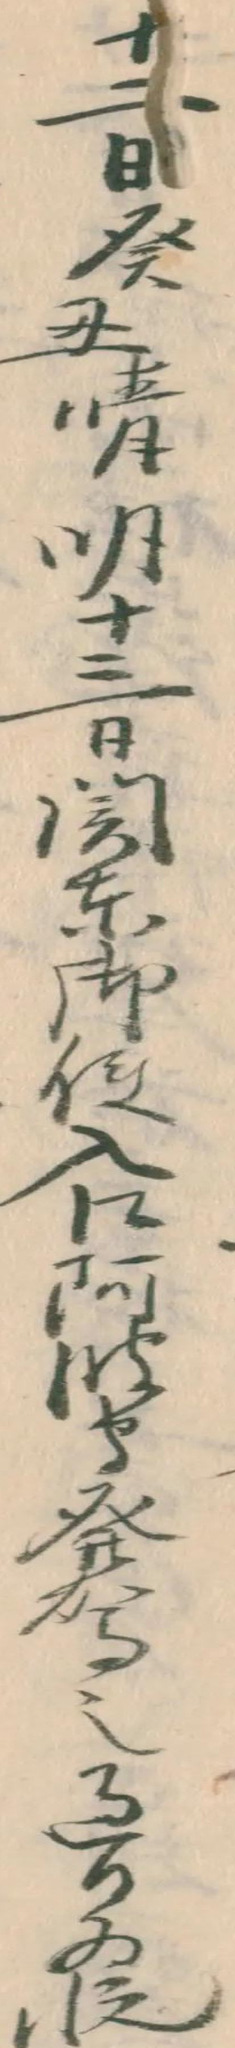十二日癸丑晴明十三日関東御使入江阿波守発駕也過日為祝
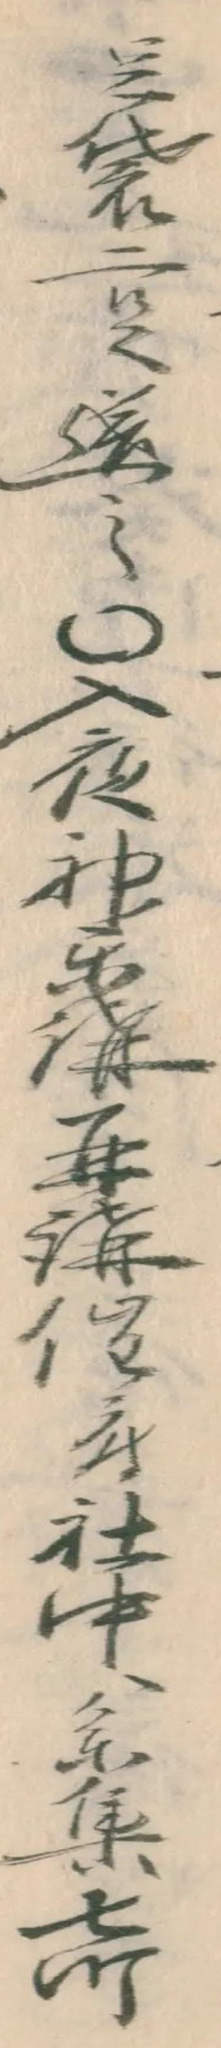足袋二足送之〇入夜神楽講再講催ニ付社中へ参集七町
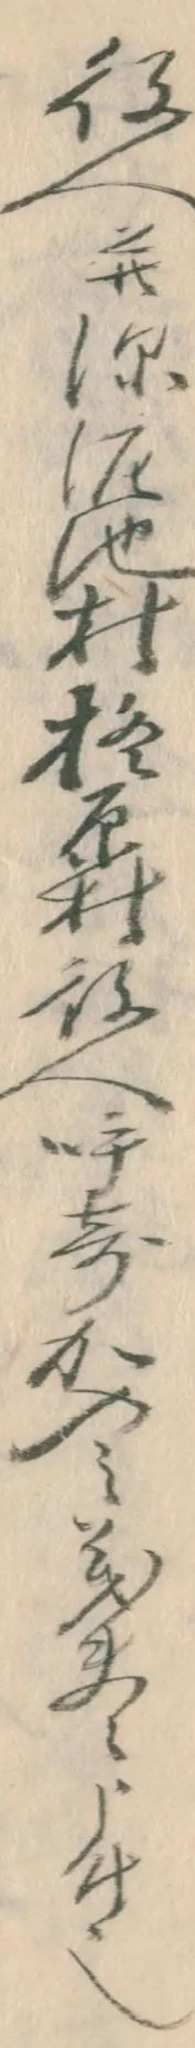役人并深泥池村柊原村役人呼寄加入之義夫々申付也
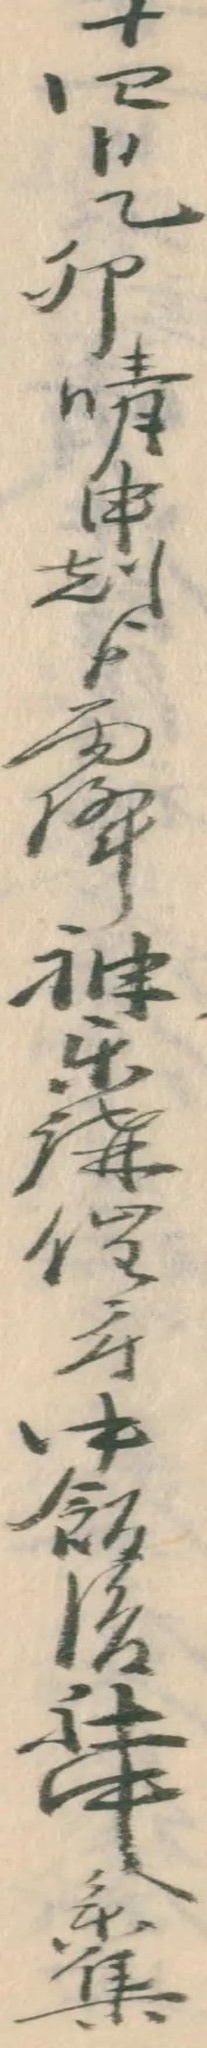十四日乙卯晴申刻ゟ雨降神楽講催ニ付中飯後社中へ参集
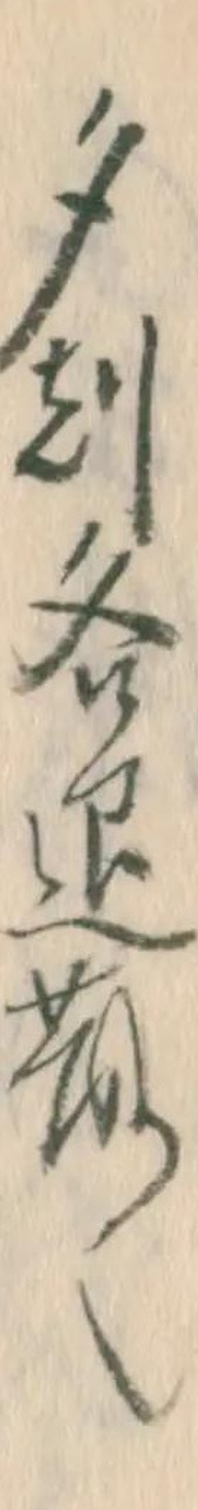夕刻各退散也
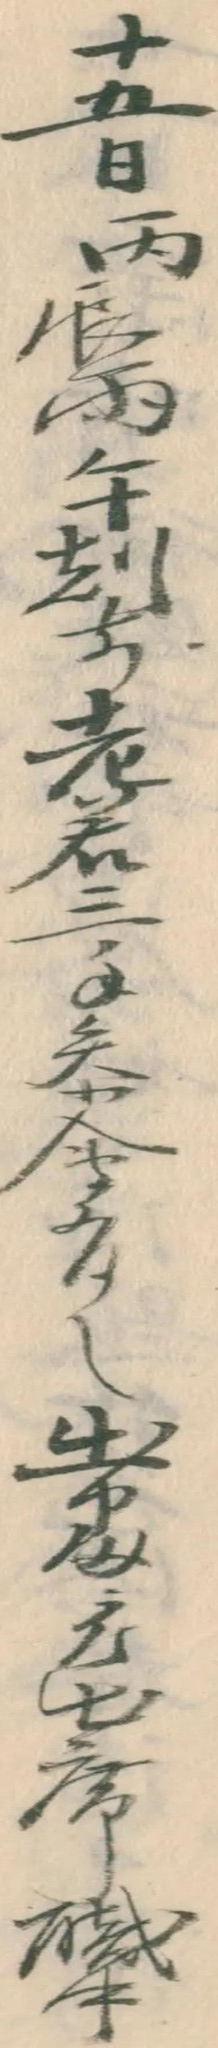十五日丙辰雨午刻老若三手参會有之出番ニ付出席職中
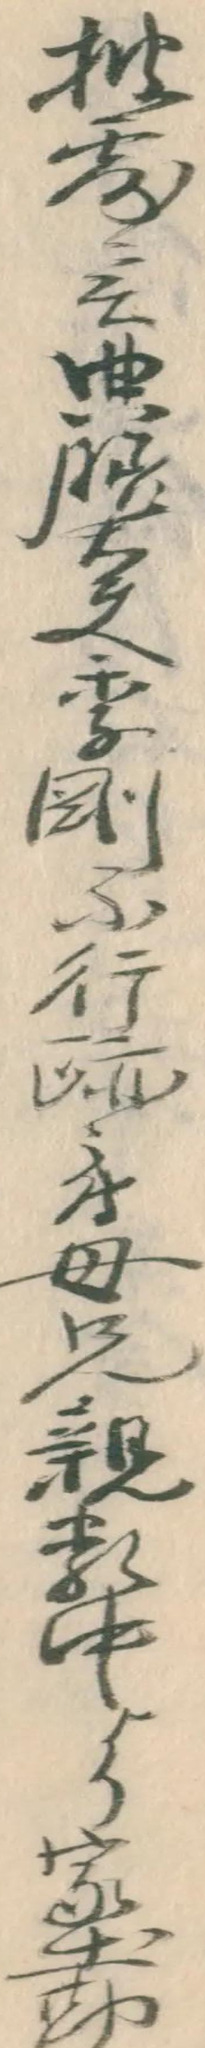披露ニ云典膳大夫季剛不行跡ニ付母兄親類中より家出勘
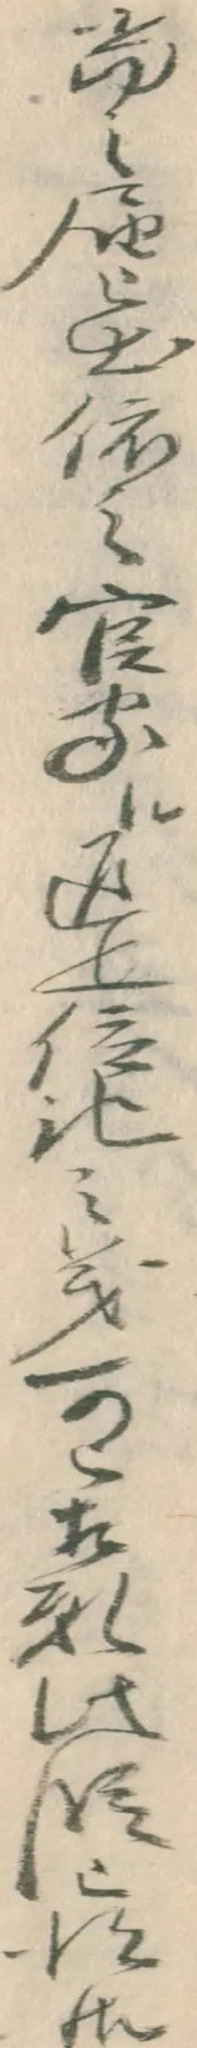當之届被出依之官家え返上位記之義可被相願此段被仰御
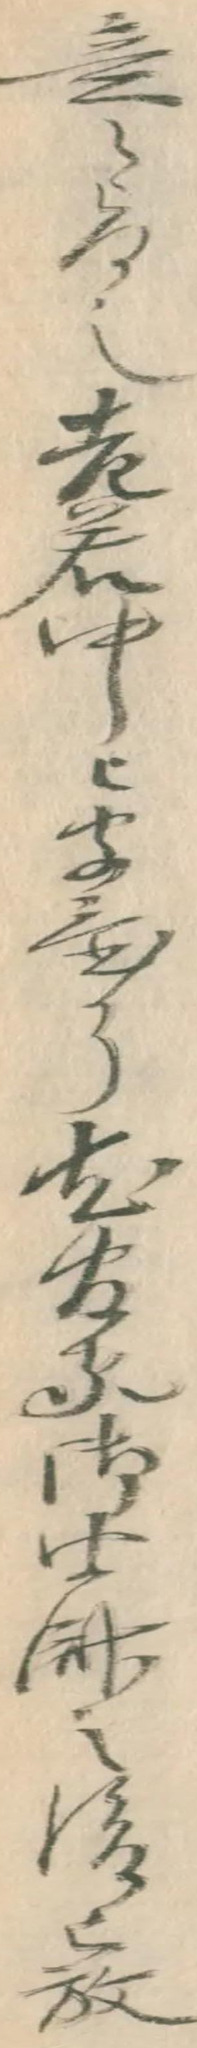意之旨之老若中被寄置了尤官家御半済之後被放

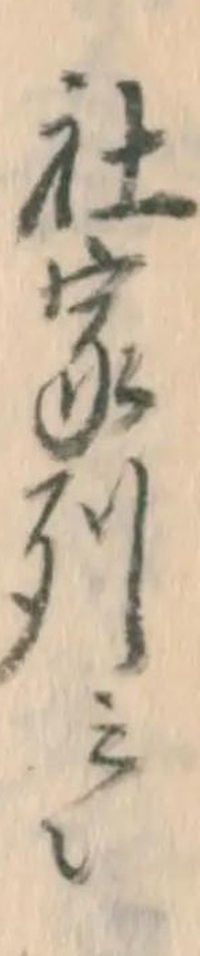社家列云々
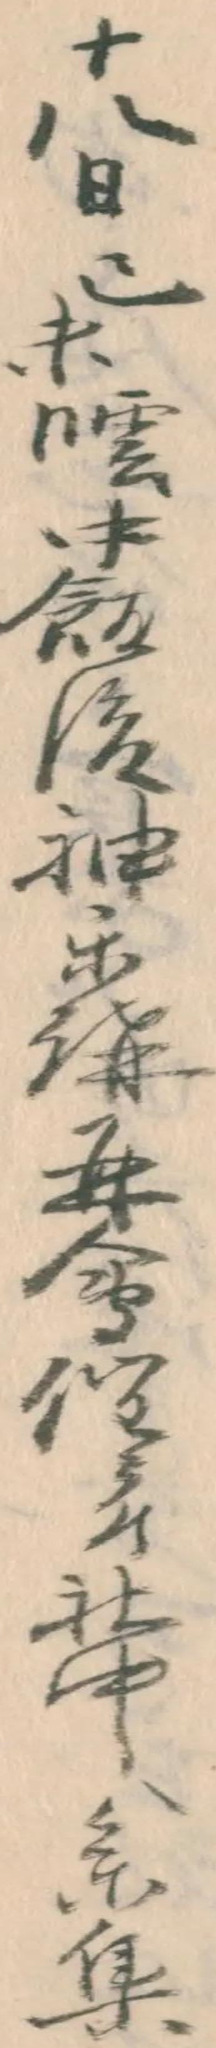十八日己未曇中飯後神楽講再會催ニ付社中へ参集
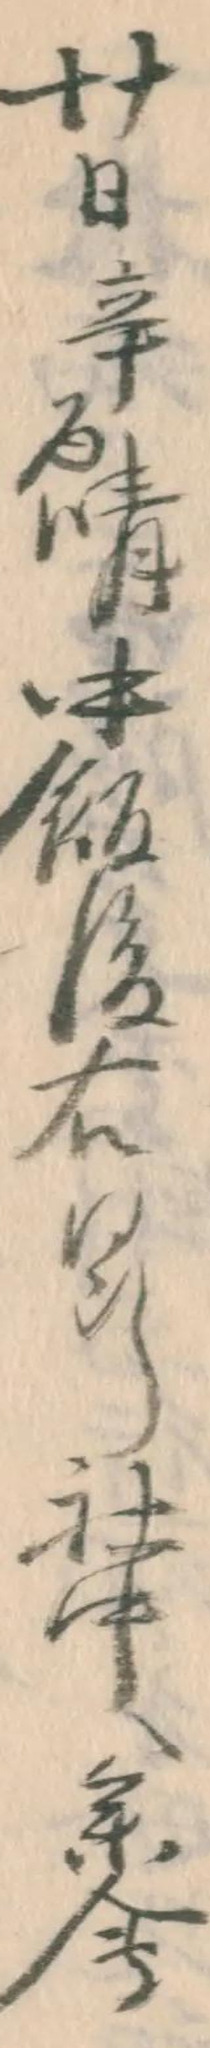廿日辛酉晴中飯後右同断社中へ参會
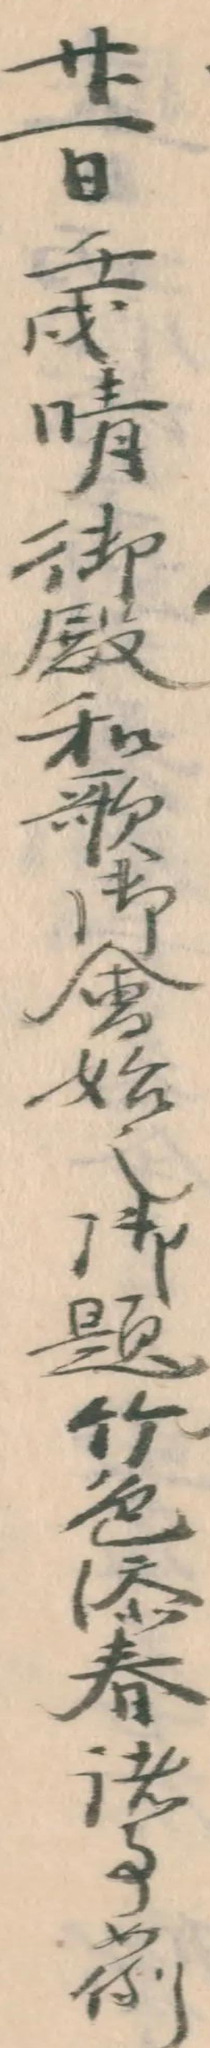廿一日壬戌晴御殿和歌御會始也御題竹色添春諸事如例
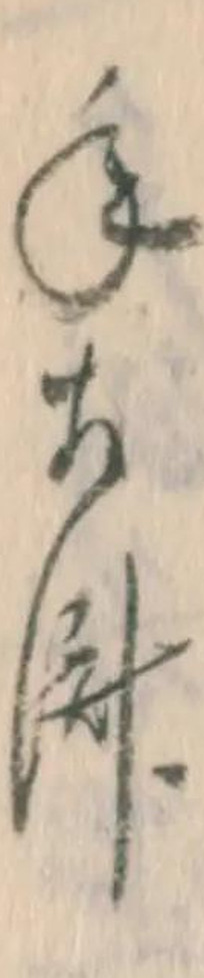年相済
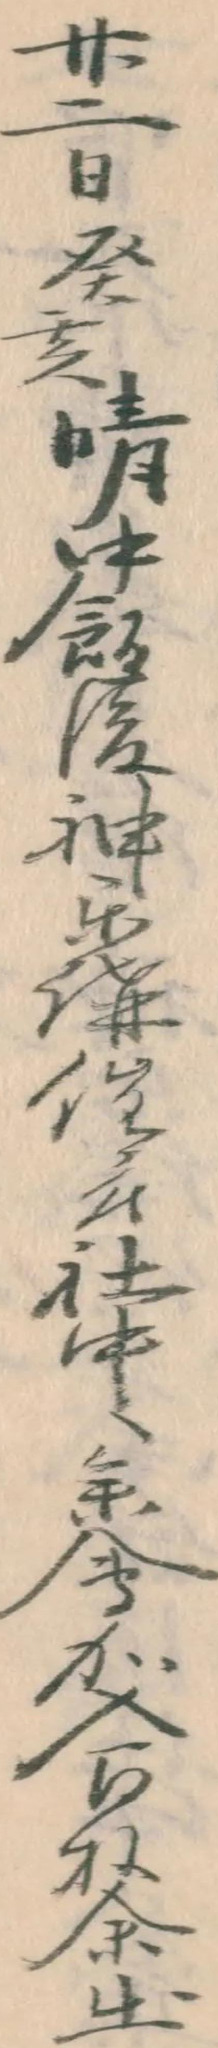廿二日癸亥晴中飯後神楽講催ニ付社中へ参會加入百枚余出
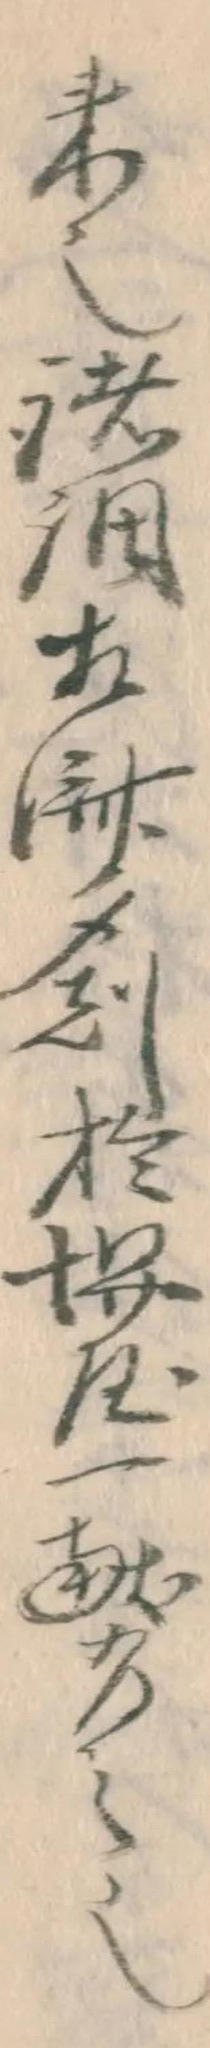来也諸調相済夕刻於堺屋一献有之也
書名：賀茂社記録. 第66冊
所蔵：国立国会図書館 National Diet Library, JAPAN
